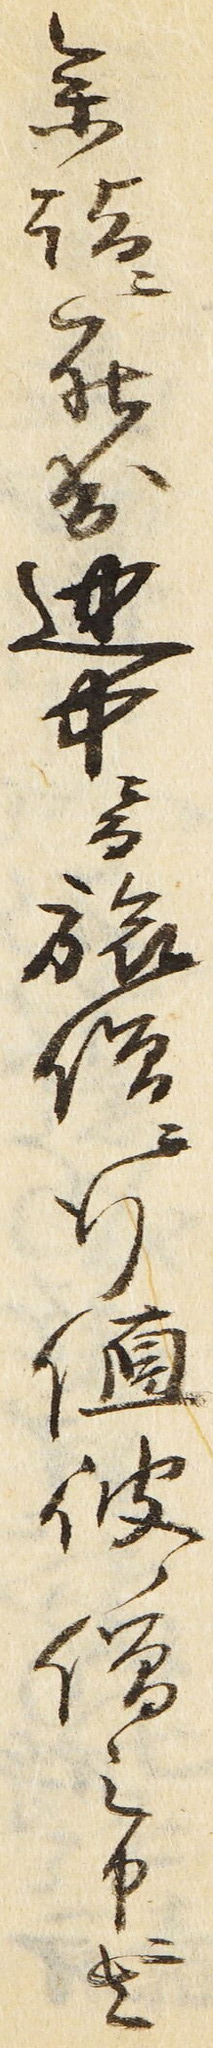参詣に罷出途中に而旅僧に行値彼ノ僧之申には
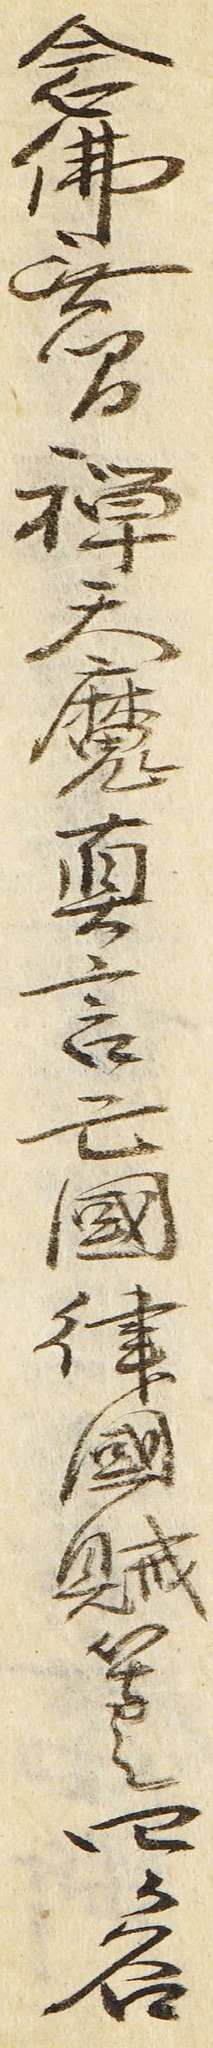念佛無間禅天魔真言亡国律国賊等の四ケ名
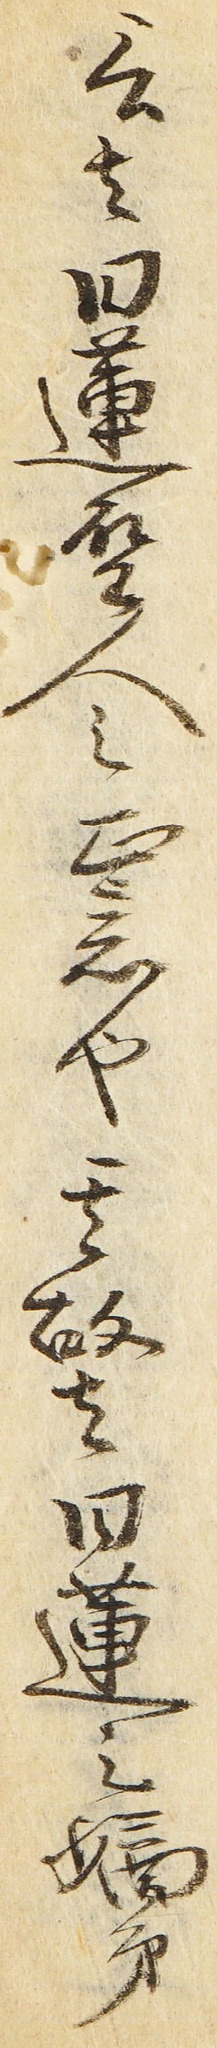言は日蓮聖人之正意也其故は日蓮之嫡弟

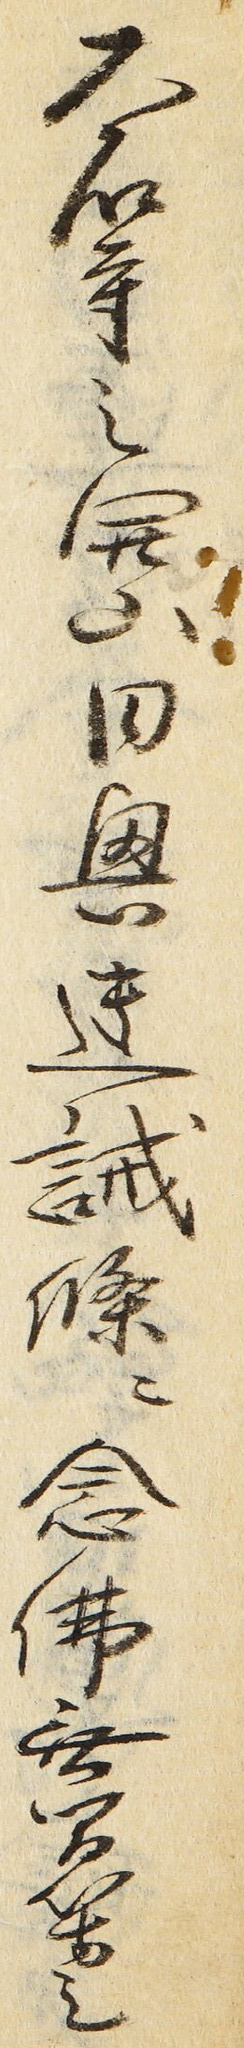大石寺之開山日興遺誡條に念佛無間等之
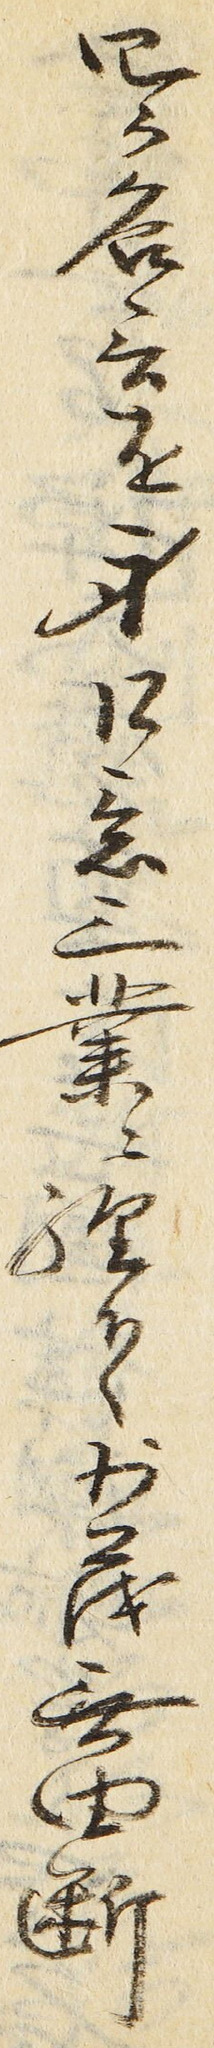四ケ名言を身口意三業に経て少も無由断
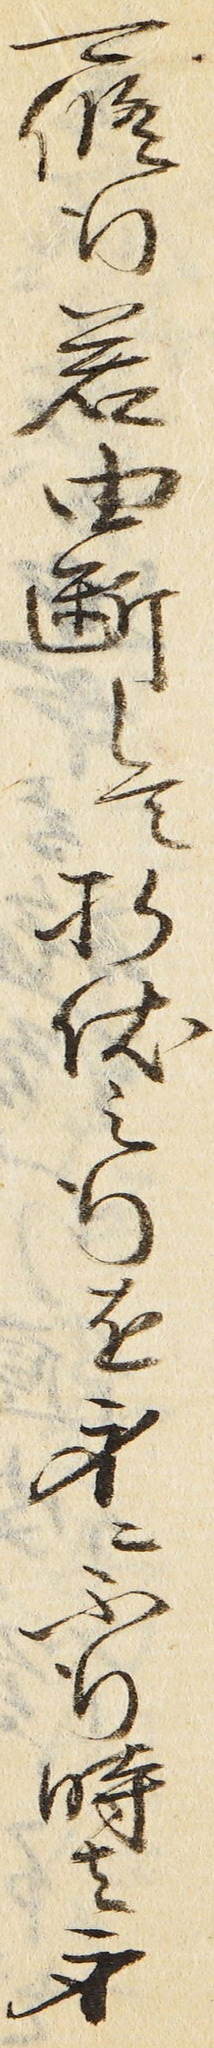可修行若由断して折伏の行を身に不行時は身
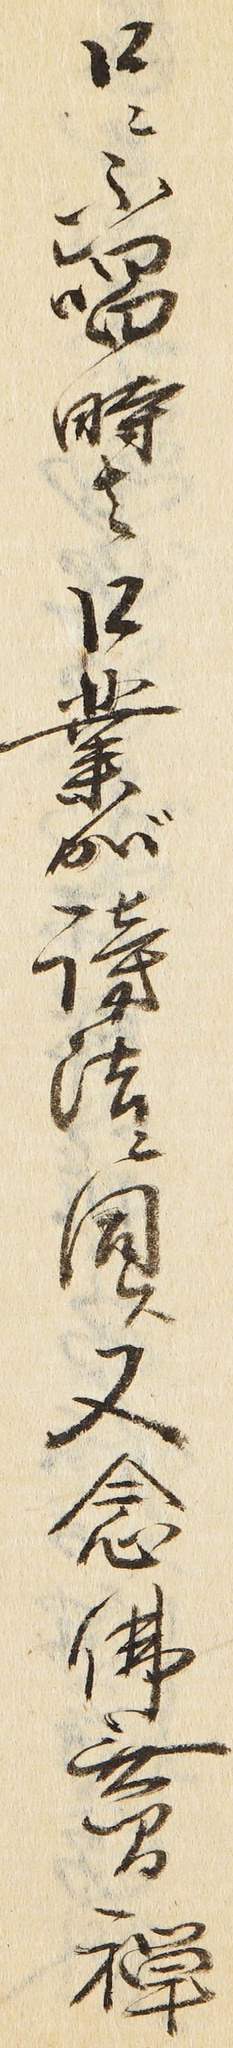口に不唱時は口業が謗法に同ス又念佛無間禅
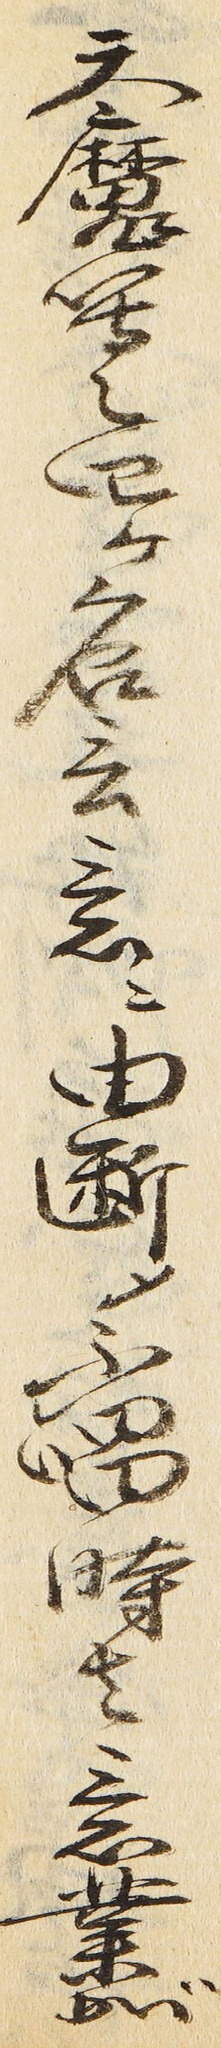天魔等之四ケ名言意に由断シテ不唱時は意業が
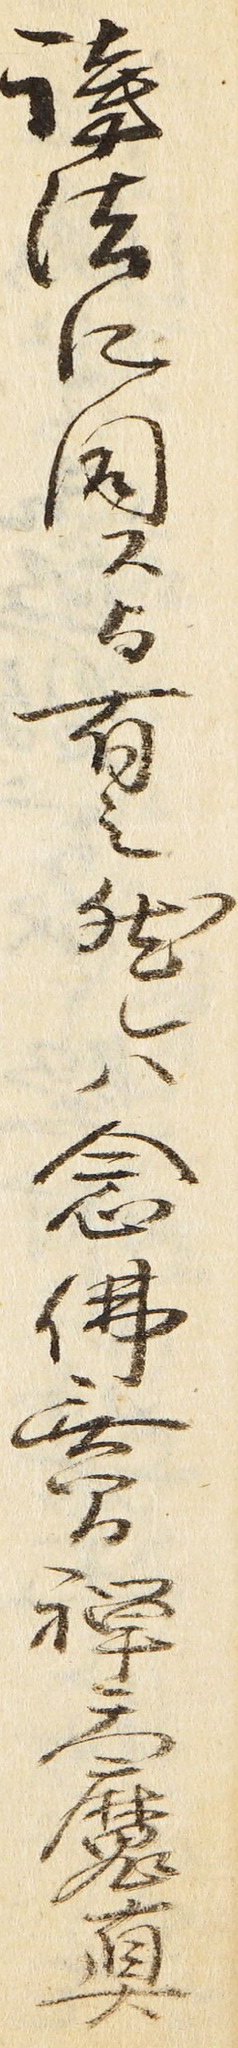謗法に同すと有之然れは念佛無間禅天魔真
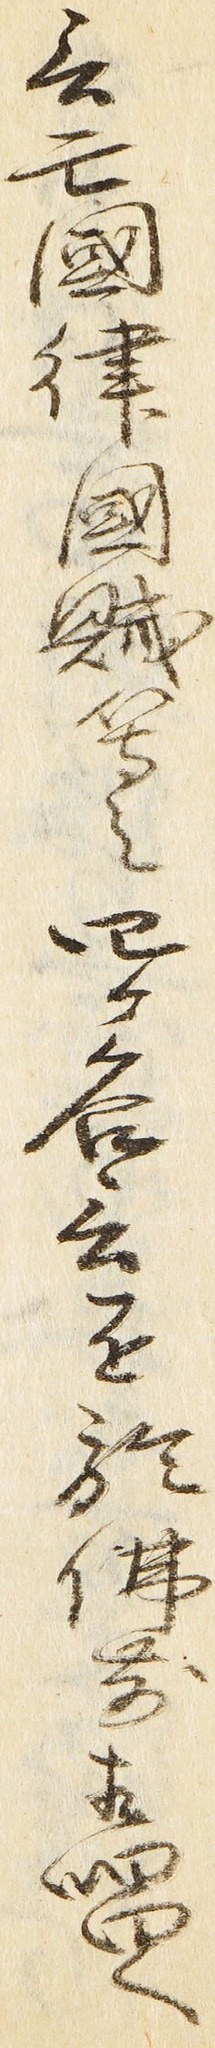言亡国律国賊等之四ケ名言を於仏前相唱へ
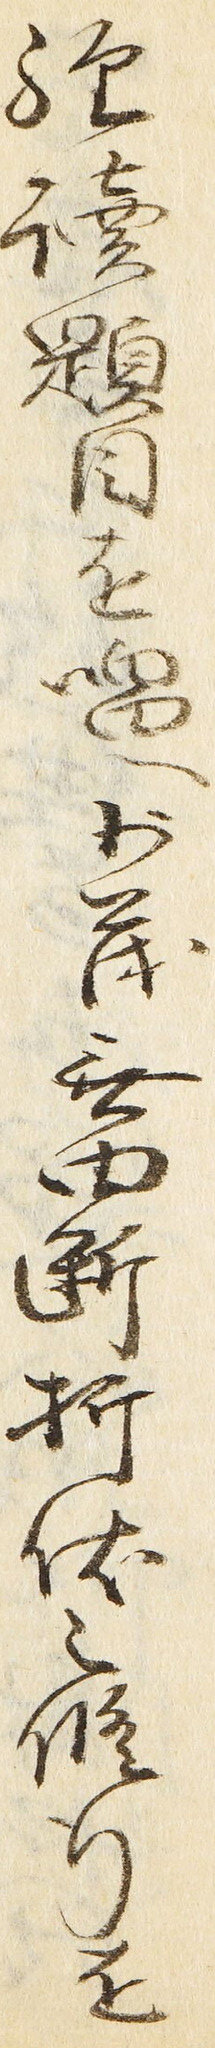経読題目を唱へ少も無由断折伏之修行を
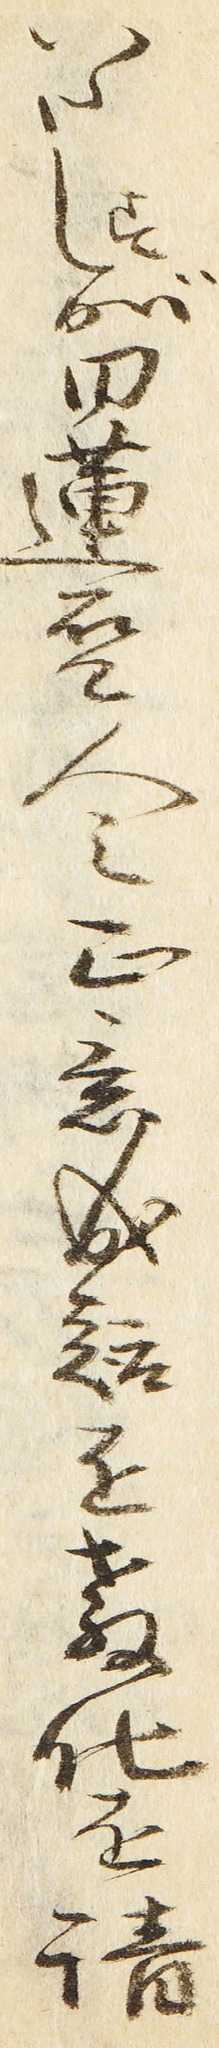いたしが日蓮聖人之正意成趣を教化を請
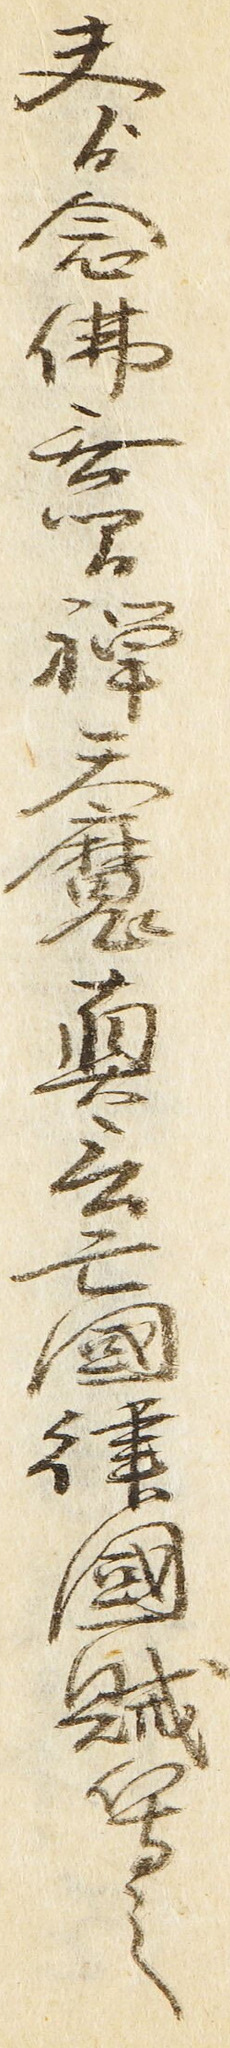夫ゟ念佛無間禅天魔真言亡国律国賊等之
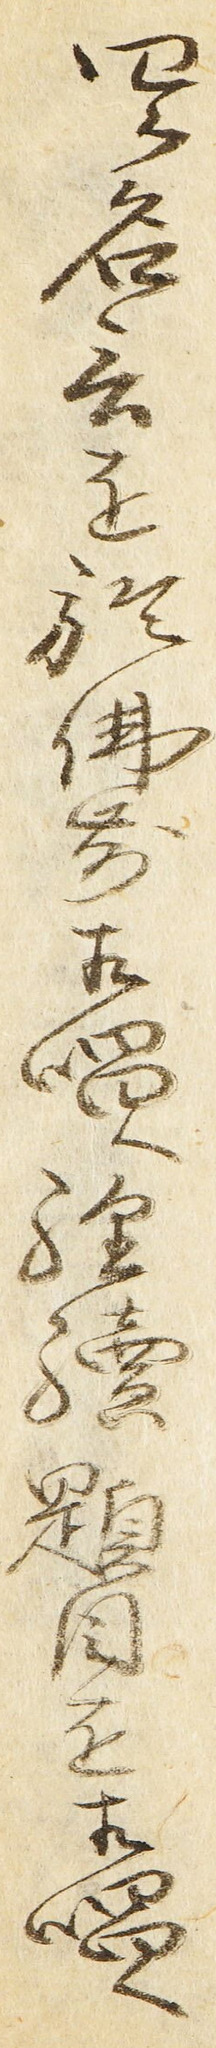四ケ名言を於仏前相唱へ経読題目を相唱へ

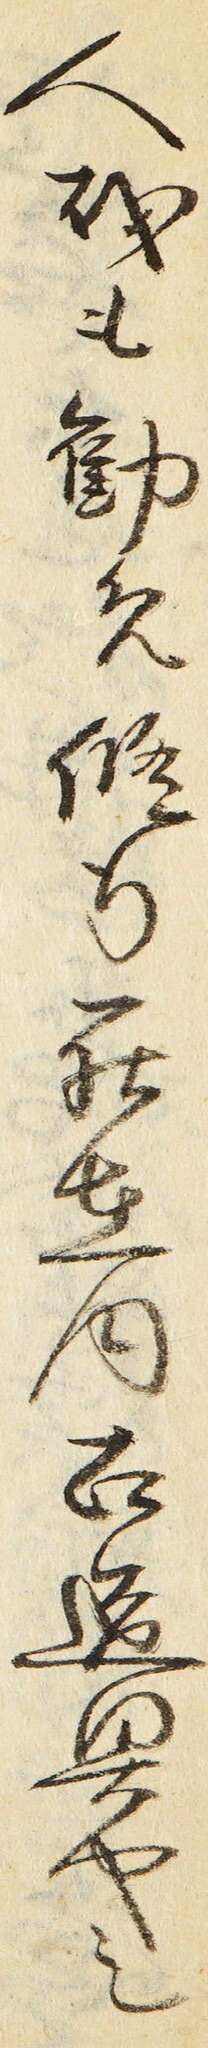人をも勧免修行罷在内古道具や之
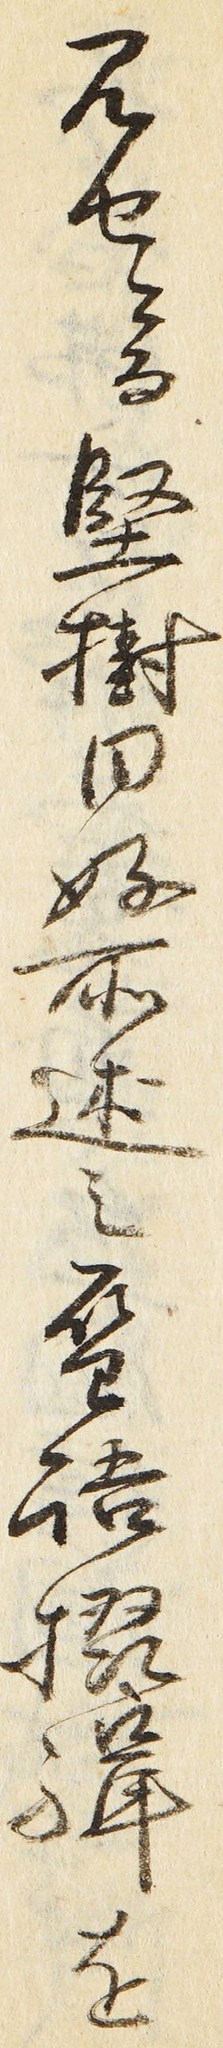見せに而堅樹日好所述之聖語撰緝を
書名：異流一件日記
